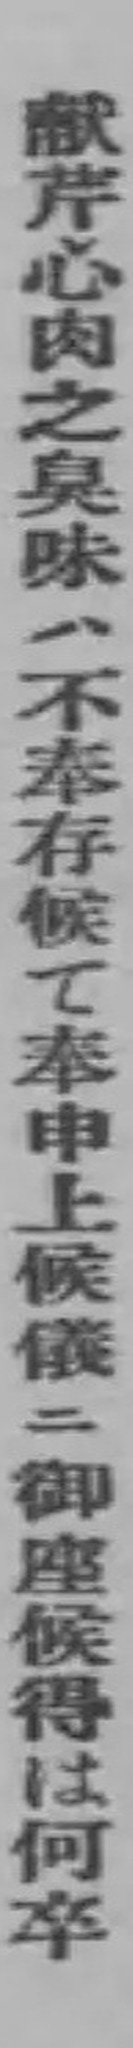献芹心肉之臭味は不奉存候て奉申上候儀ニ御座候得は何卒
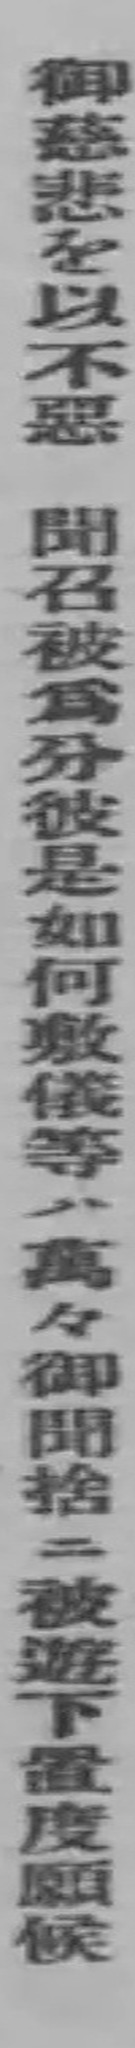御慈悲を以不悪聞召被為分彼是如何敷儀等ハ万々御聞捨ニ被遊下置度願候
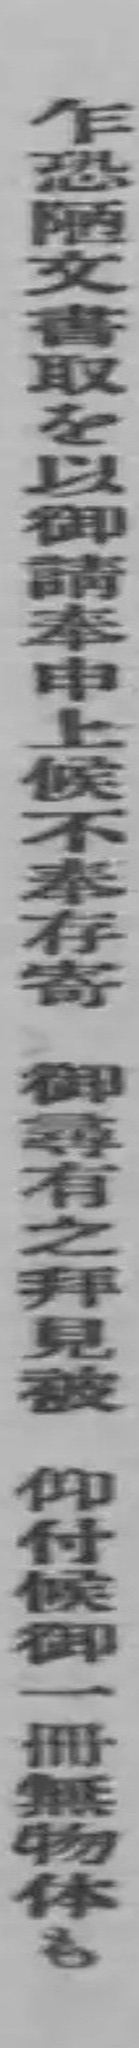乍恐陋文書取を以御請奉申上候不奉存寄御尋有之拝見被仰付候御一冊無物体も
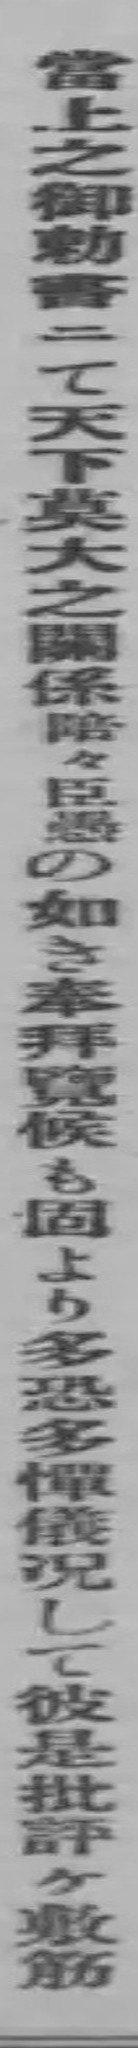当上之御勅書ニて天下莫大之関係陪々臣愚の如き奉拝覧候も固より多恐多憚儀況して彼是批評ケ敷筋
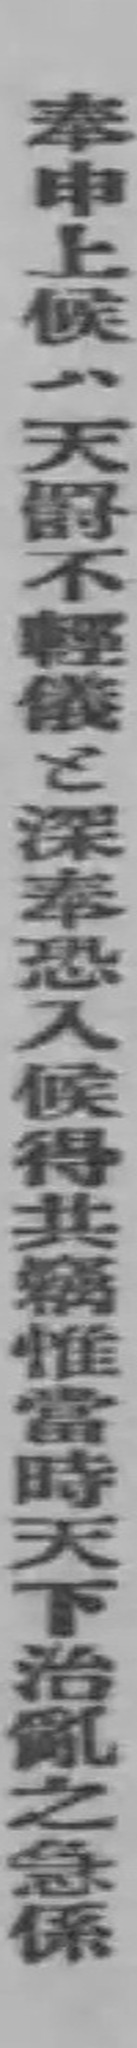奉申上候ハ天罸不軽儀と深奉恐入候得共竊惟当時天下治乱之急係
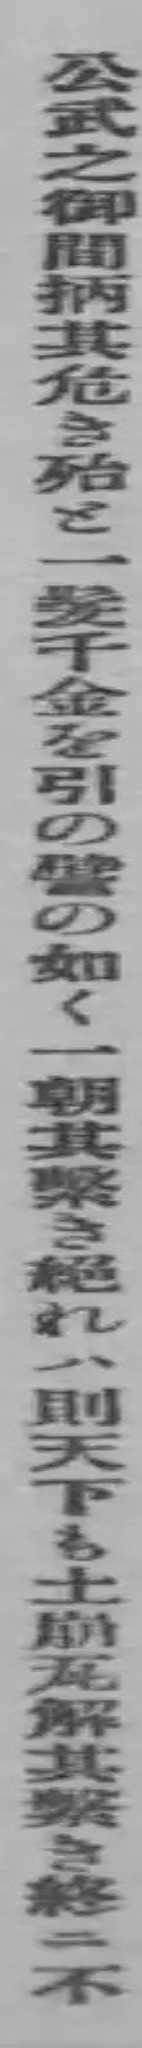公武之御間柄其危き殆と一髪千金を引の譬の如く一朝其繋き絶れハ則天下も土崩瓦解其繋き終ニ不
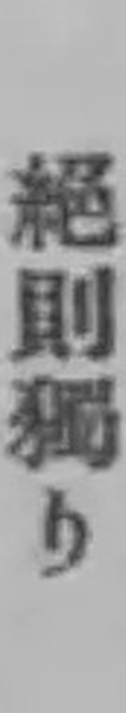絶則独り
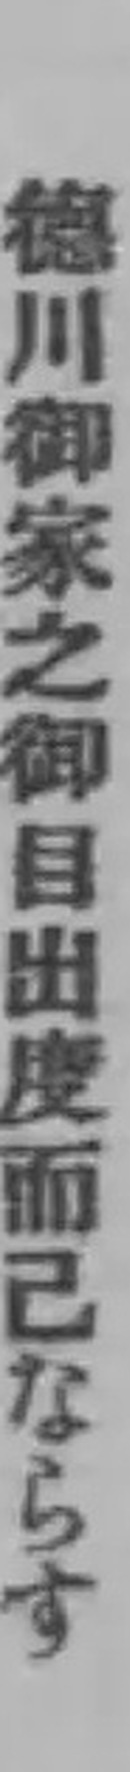徳川御家之御目出度而己ならす
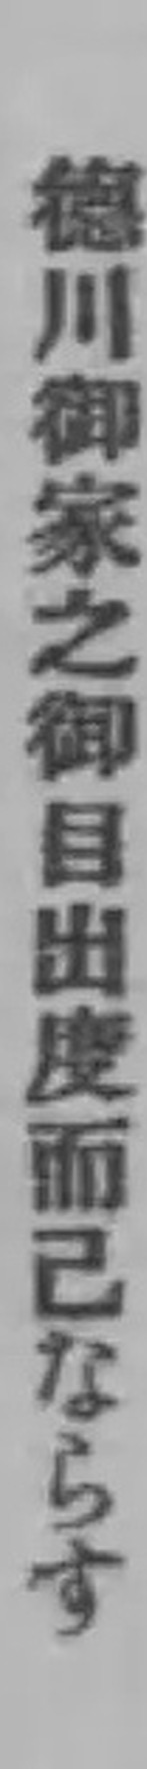徳川御家之御目出度而己ならす
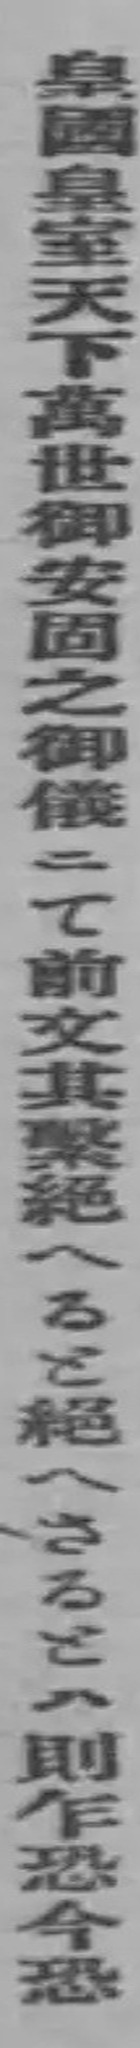皇国皇室天下万世御安固之御儀ニて前文其繋絶へると絶へさるとハ則乍恐今恐

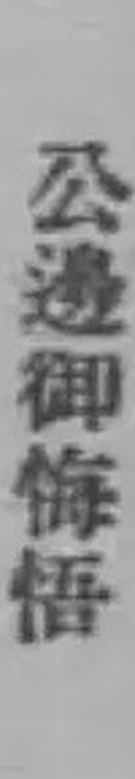公辺御悔悟
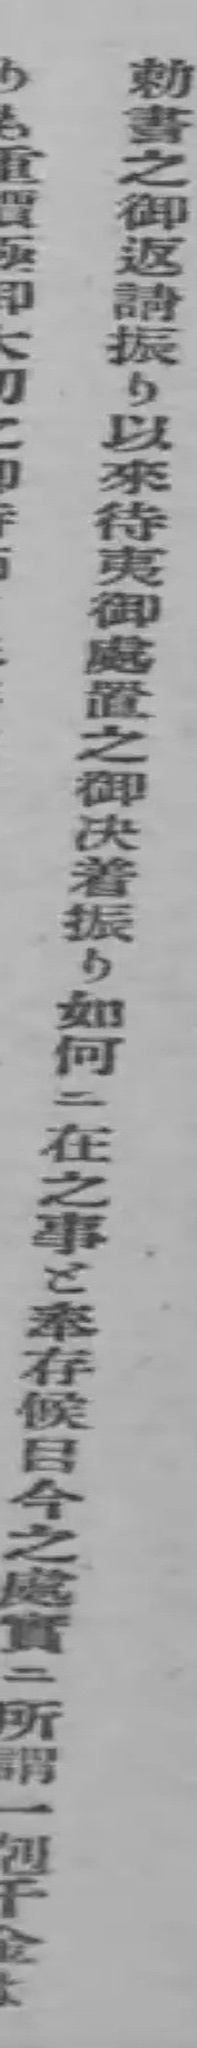勅書之御返請振り以来待夷御処置之御決着振り如何ニ在之事と奉存候目今之処実ニ所謂一剋千金よ
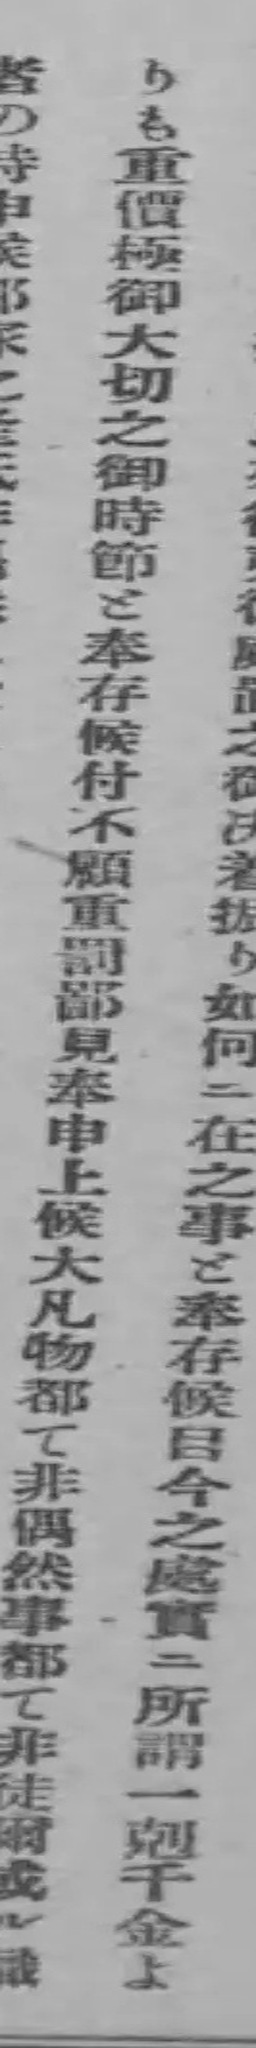りも重価極御大切之御時節と奉存候付不顧重罰鄙見奉申上候大凡物都て非偶然事都て非徒爾或ル識
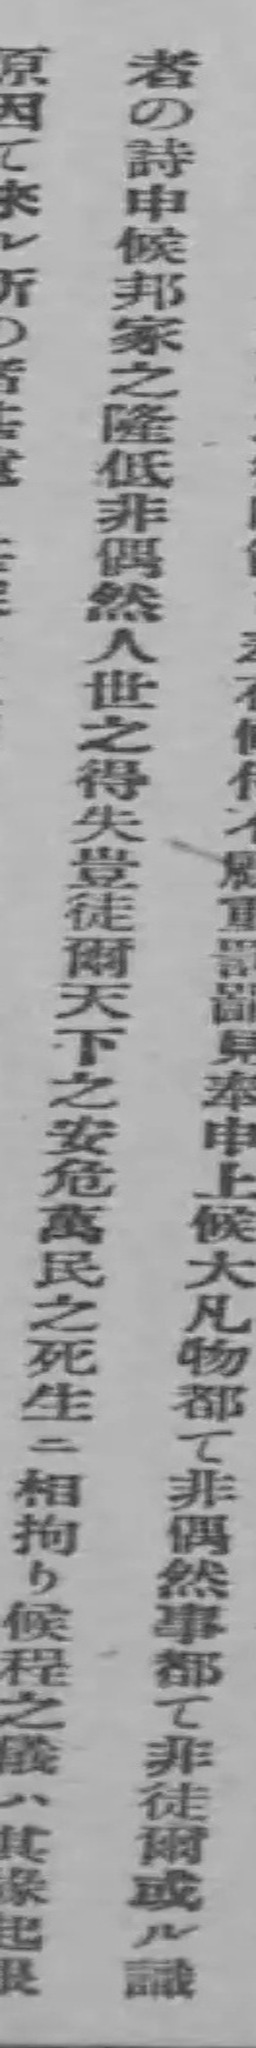者の詩申候邦家之隆低非偶然人世之得失豊徒爾天下之安危万民之死生ニ相拘り候程之儀ハ其縁起根
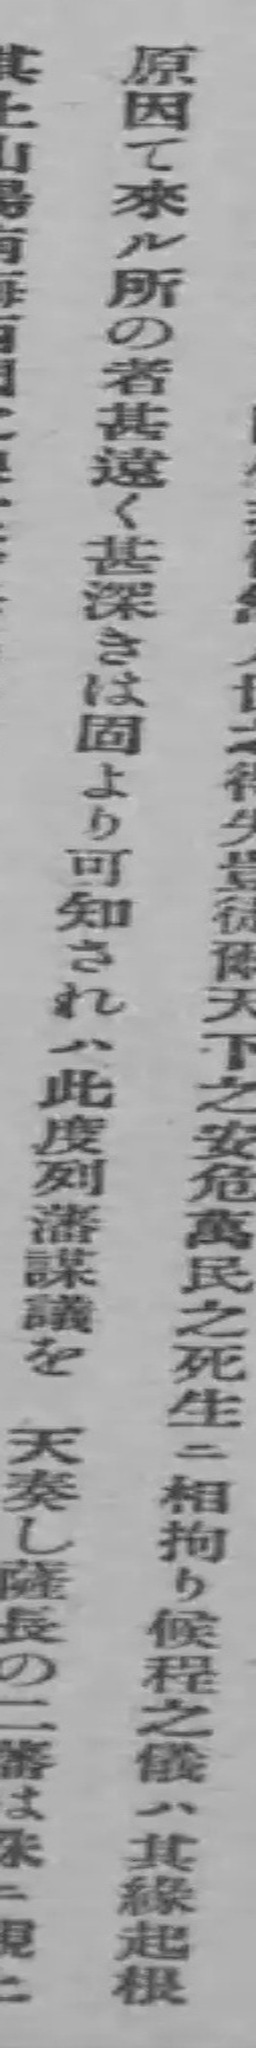原因て来ル所の者甚遠く甚深きは固より可知されハ此度列藩謀議を天奏し薩長の二藩は殊ニ親上
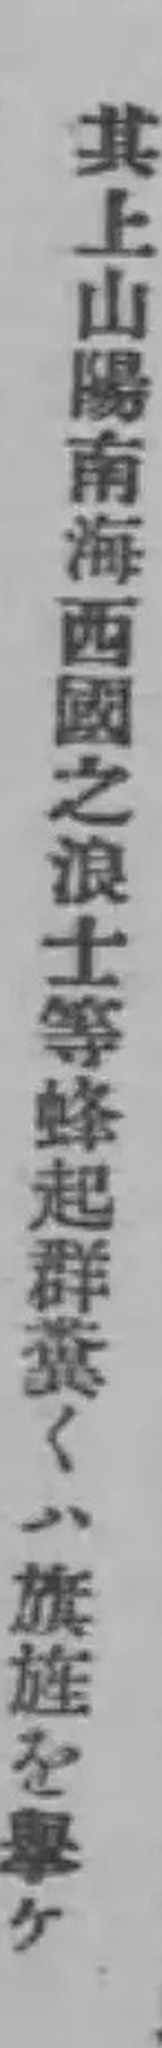其上山陽南海西国之浪士等蜂起群糞くハ旗旌を挙ケ
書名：豊橋市史談
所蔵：国立国会図書館 National Diet Library, JAPAN
